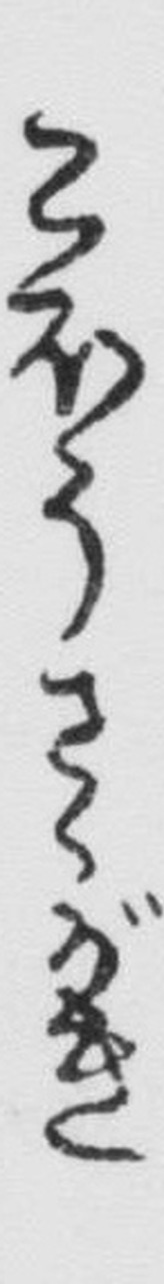こほうさゝがき
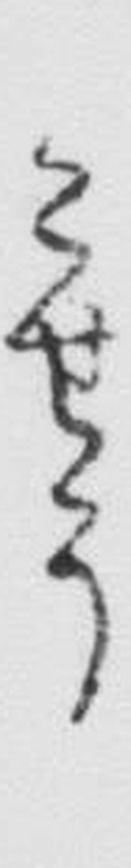こせう
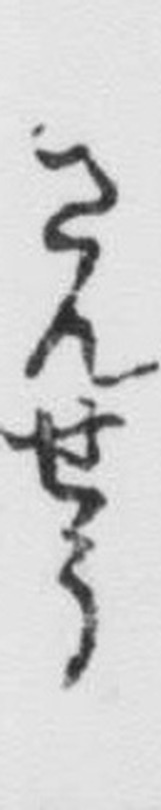さんせう
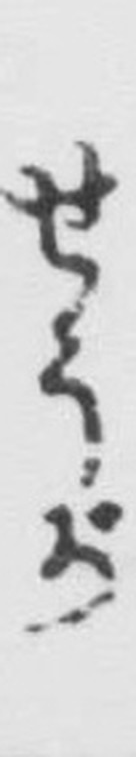せうが
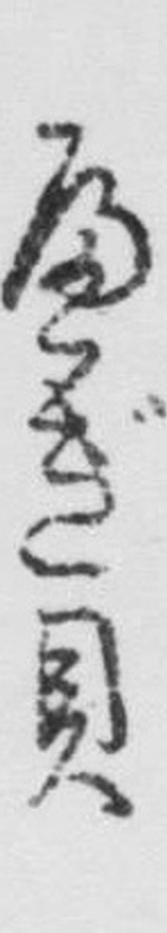へぎ貝
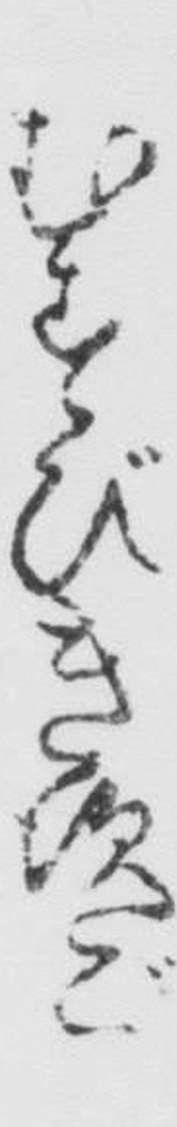むすびきすご
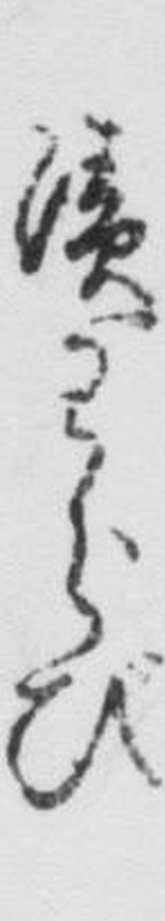漬わらび
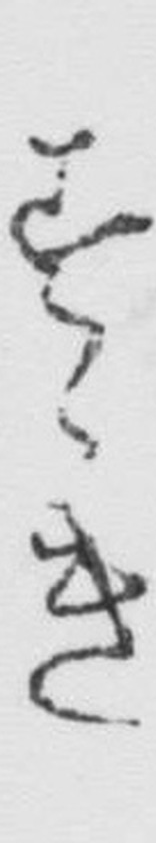すゝき
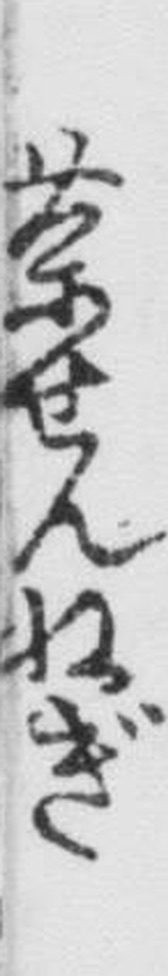茶せんねぎ
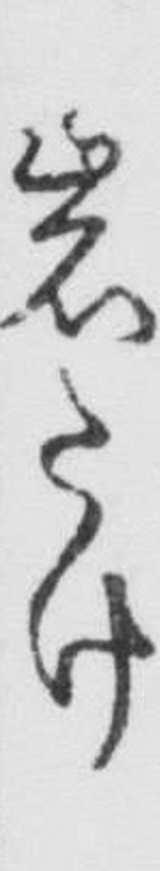岩たけ
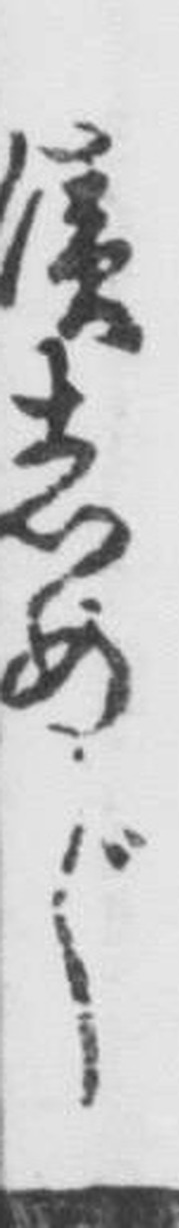漬しめじ

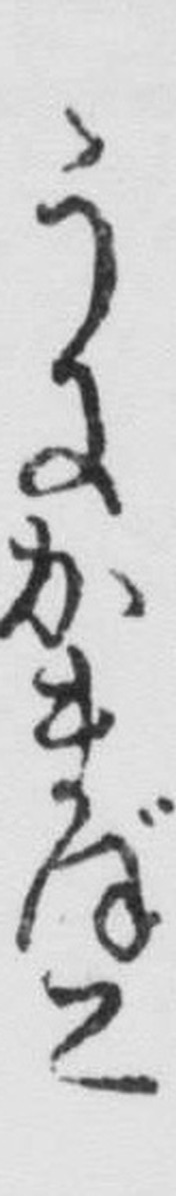うにかまぼこ
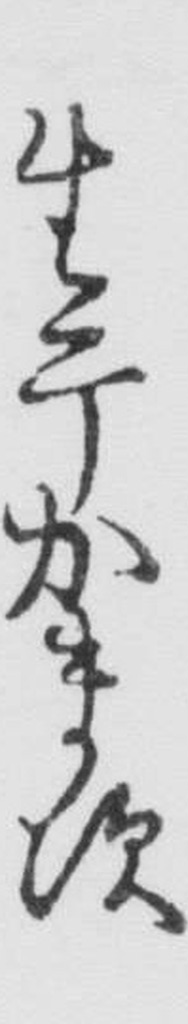生干かます
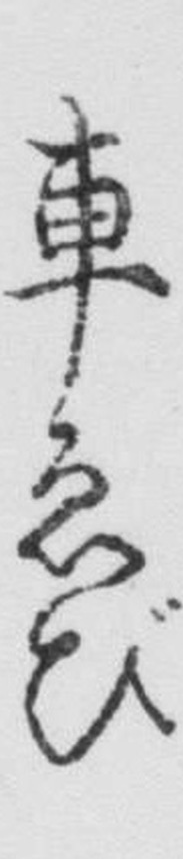車ゑび
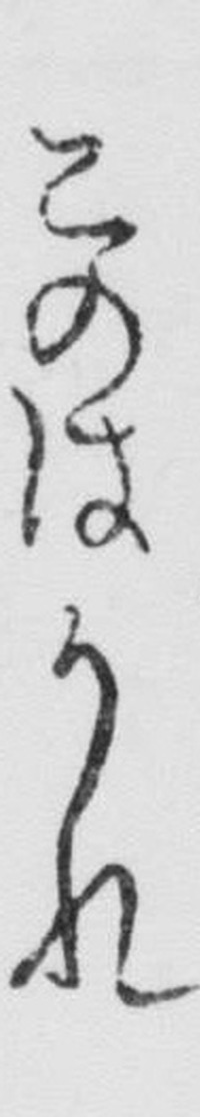このはかれ
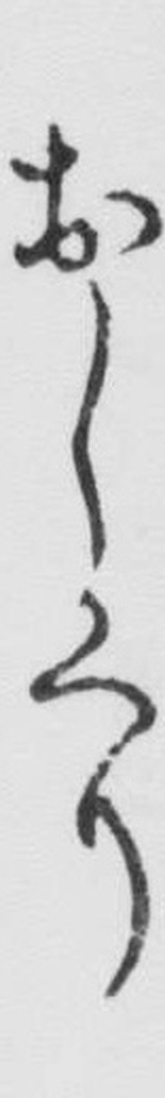おしくり
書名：諸家通用/即席料理
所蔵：大阪府立大学学術情報センター 国文学研究資料館
